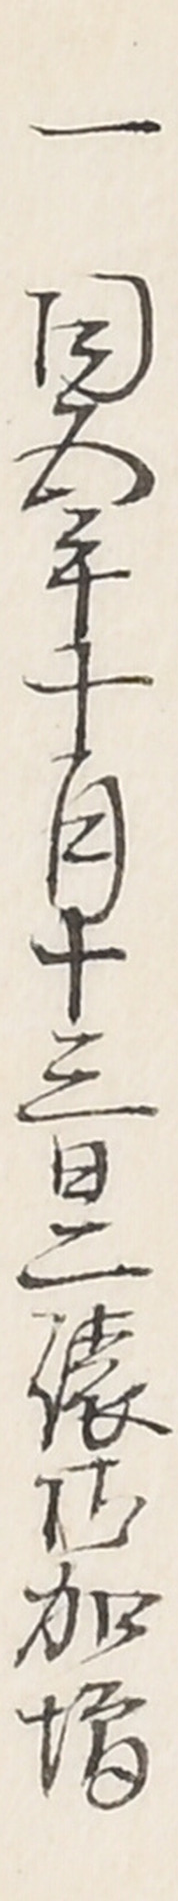一同五午十月十三日二俵御加増
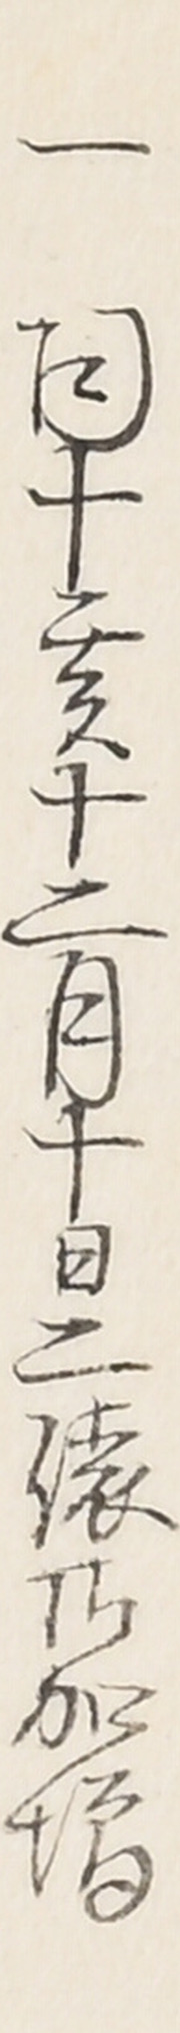一同十亥十二月十日二俵御加増
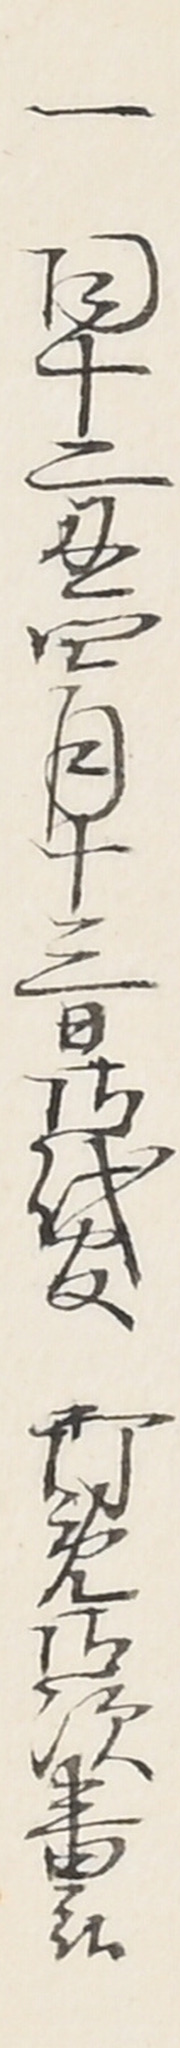一同十二丑四月十三日御代官御免御次番被
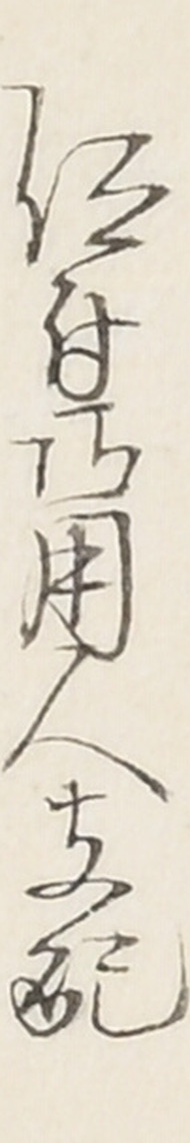仰付御用人支配
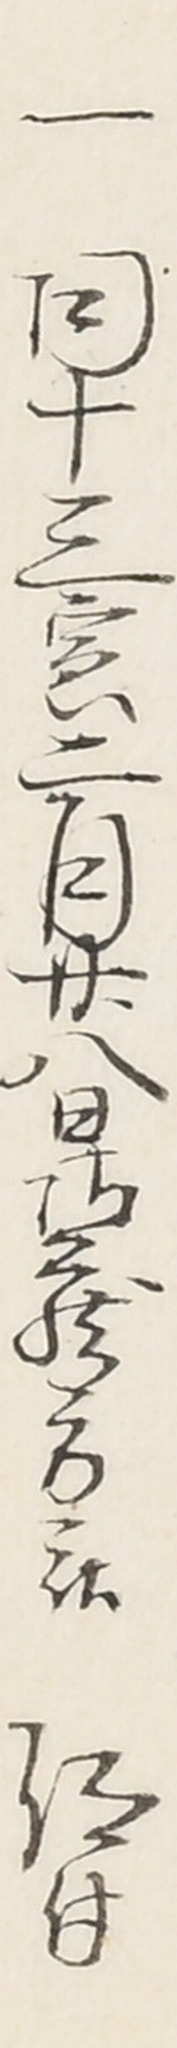一同十三寅二月廿八御蔵方被仰付
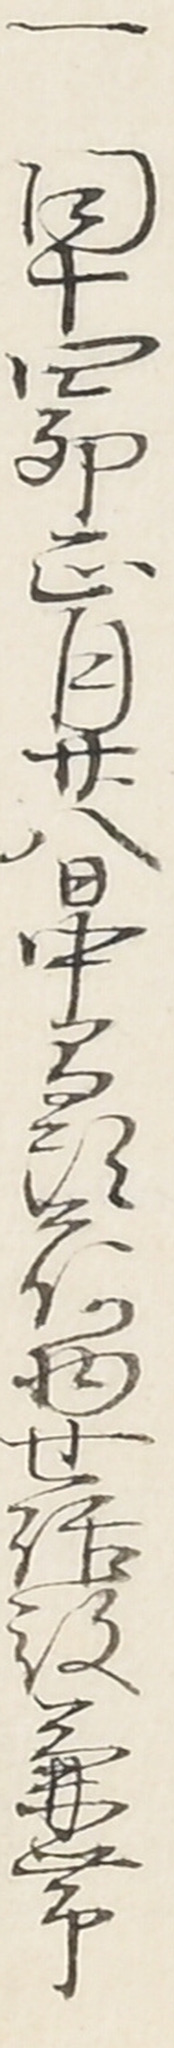一同十四卯正月廿八日中間頭荷物世話役兼帯
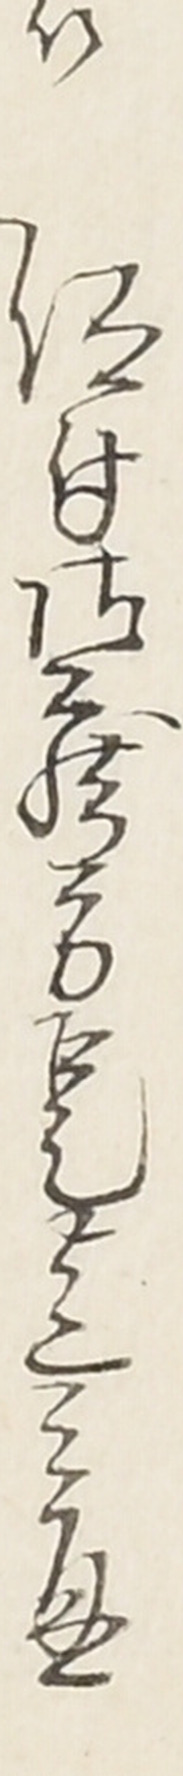被仰付御蔵方是迄之通
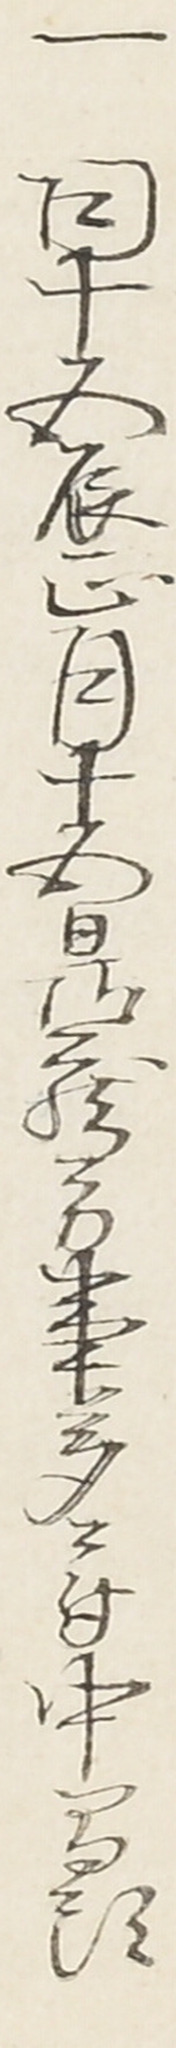一同十五辰正月十五日御蔵方事多ニ付中間頭
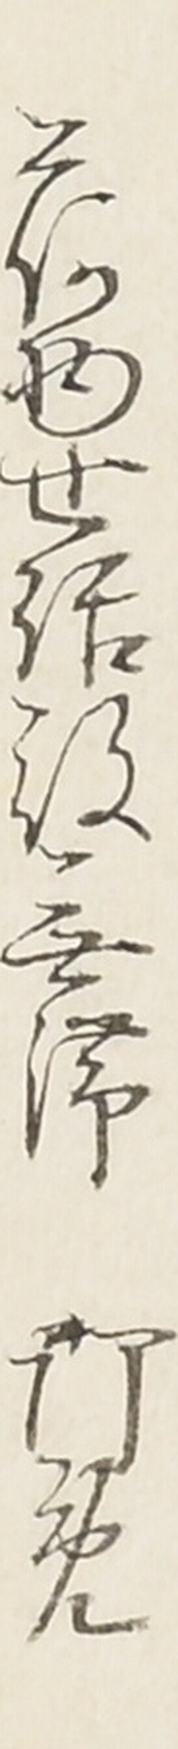荷物世話役無滞御免
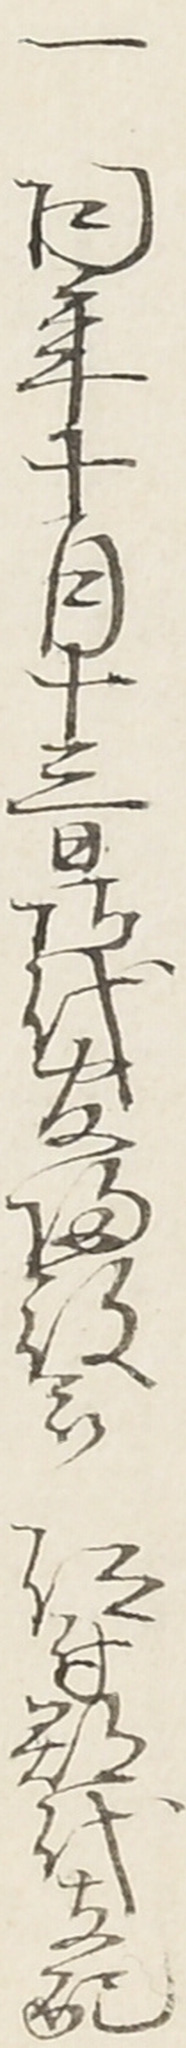一同年十月十三日御代官帰役被仰付郡代支配
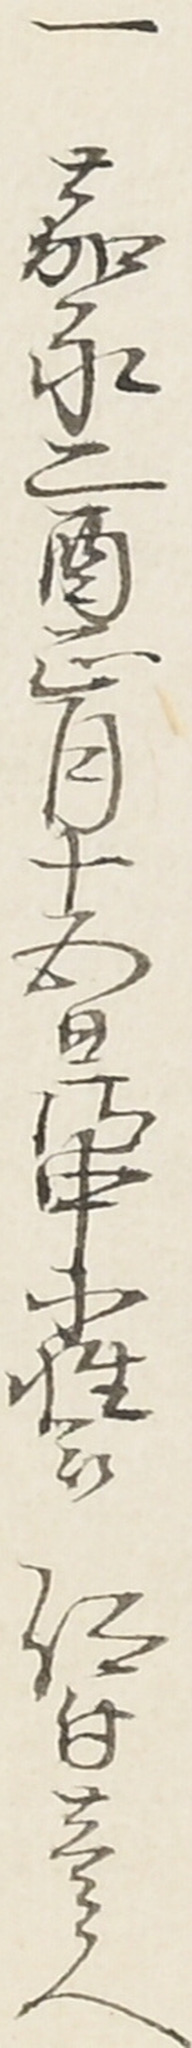一嘉永二酉正月十五日御中小性被仰付壱人
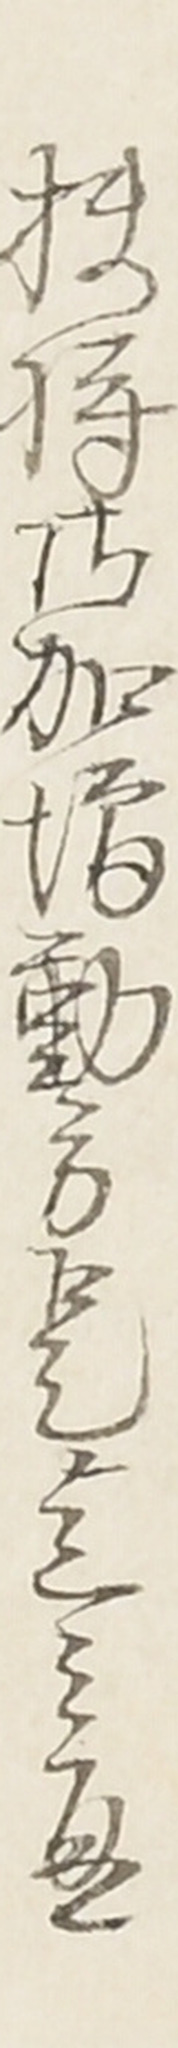扶持御加増勤方是迄之通

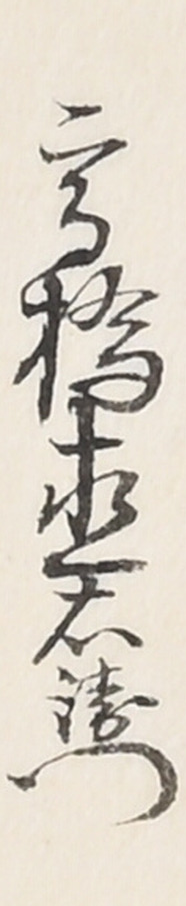高橋直右衛門
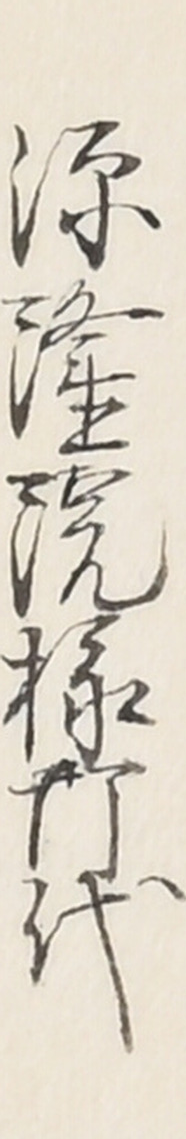源隆院様御代
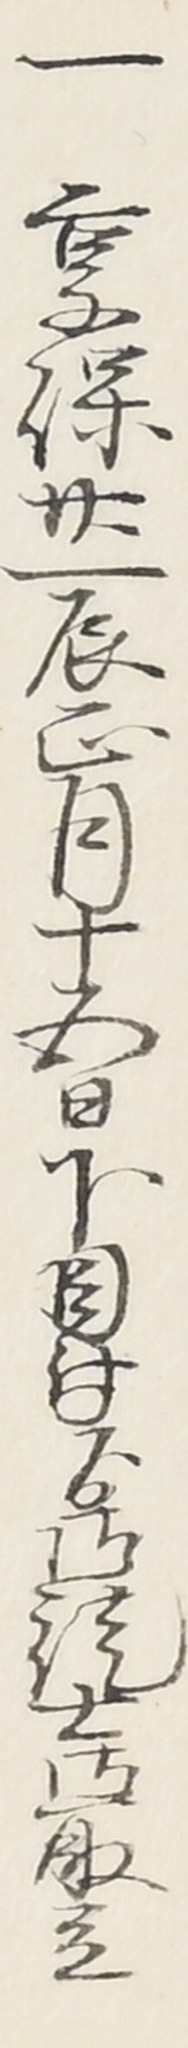一享保廿一辰正月十五日下目付ゟ御徒士御取立
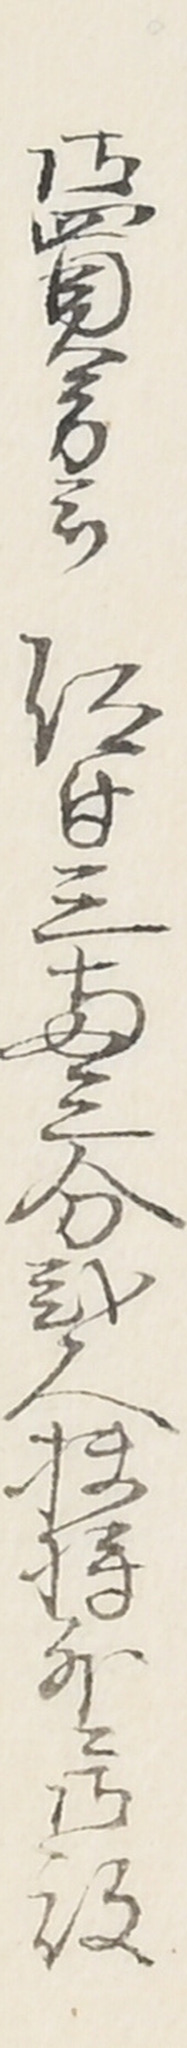御買方被仰付三両三分弐人扶持外ニ御役
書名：無足諸士勤仕録（四）
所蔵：伊那市立高遠町図書館・合同会社AMANE
